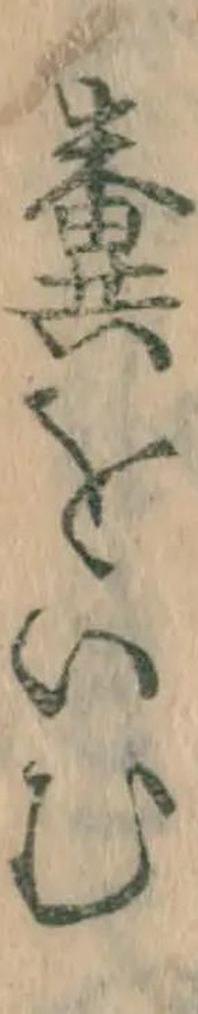糞をいむ

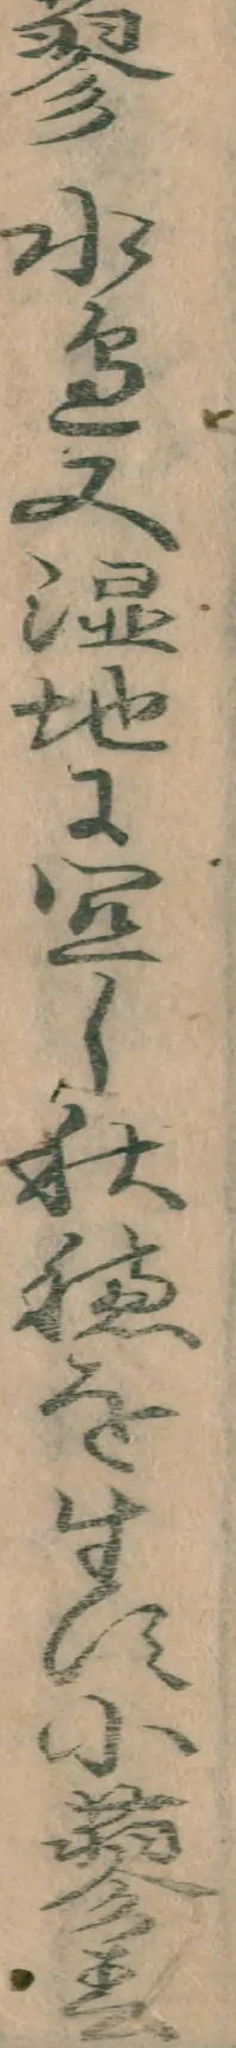蓼水辺又は湿地に宜し秋穂を生す小蓼春
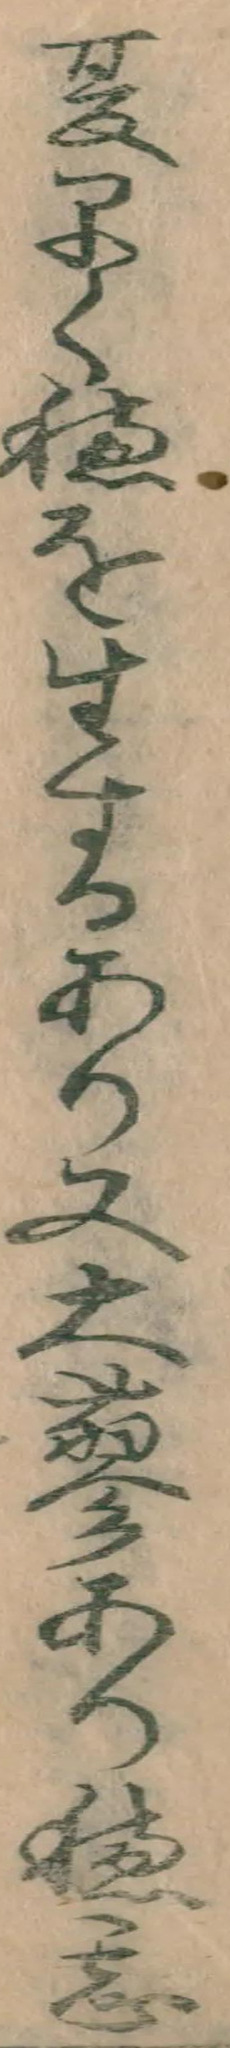夏早く穂を生するあり又大蓼あり穂甚
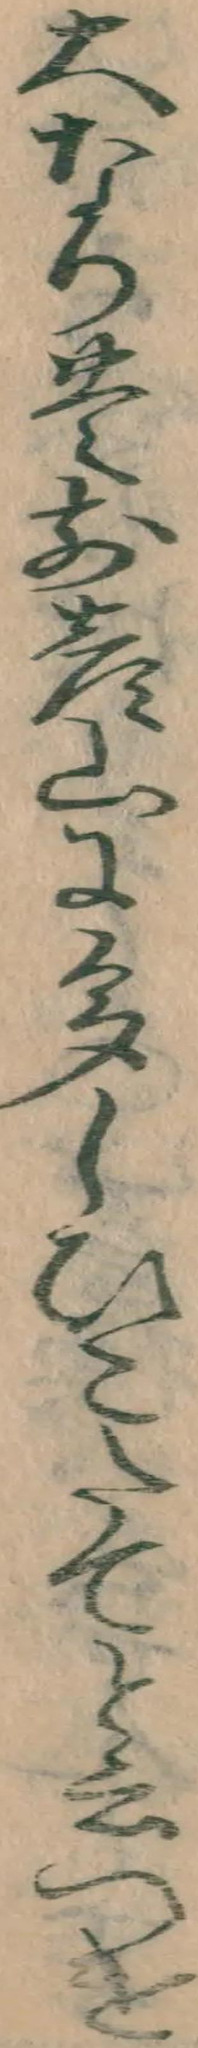大なり豊前彦山に多しひこたてと云つけ
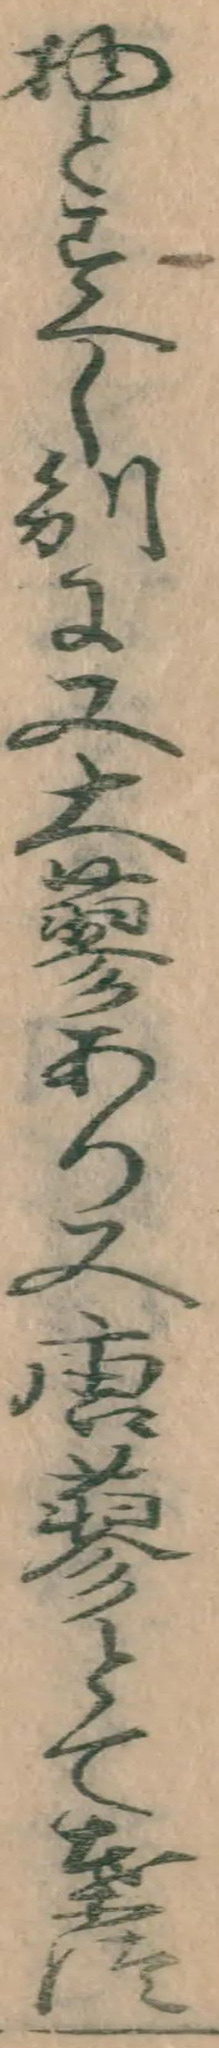物とすへし別に又大蓼あり又唐蓼とて葉つ
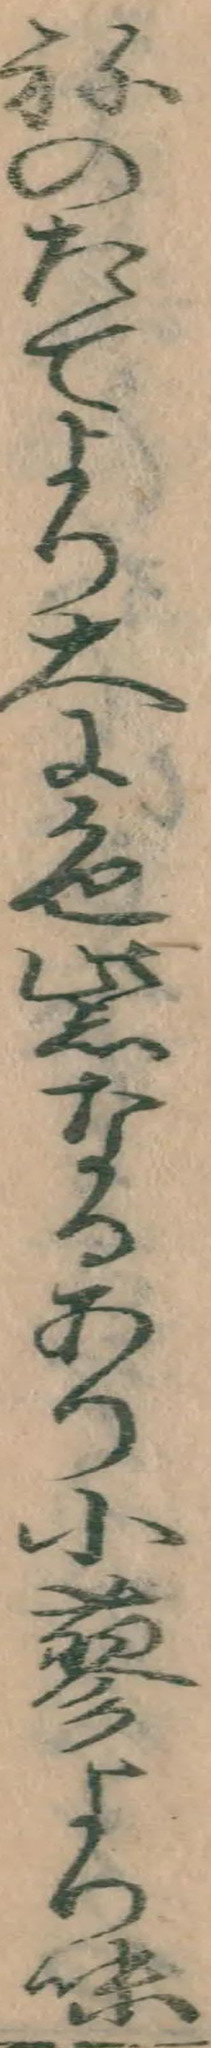ねのたてより大に色紫なるあり小蓼より味
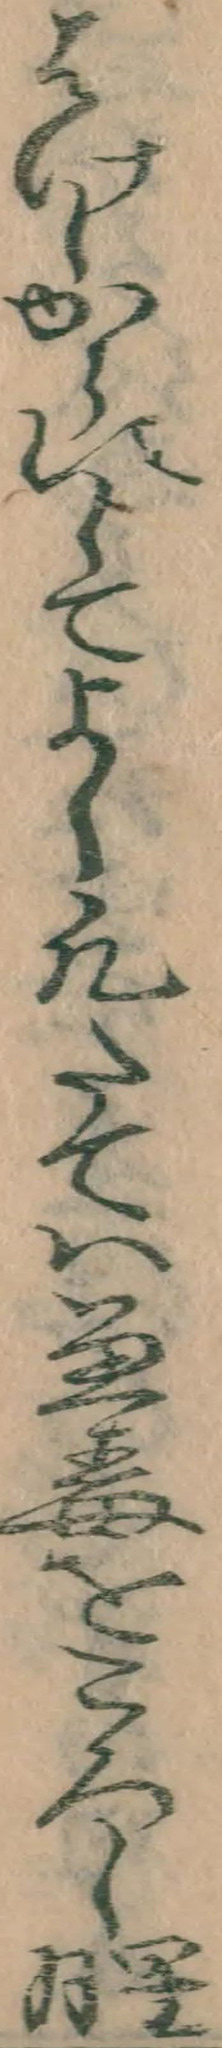はけしからすしてよく凡たては魚毒をころし肝
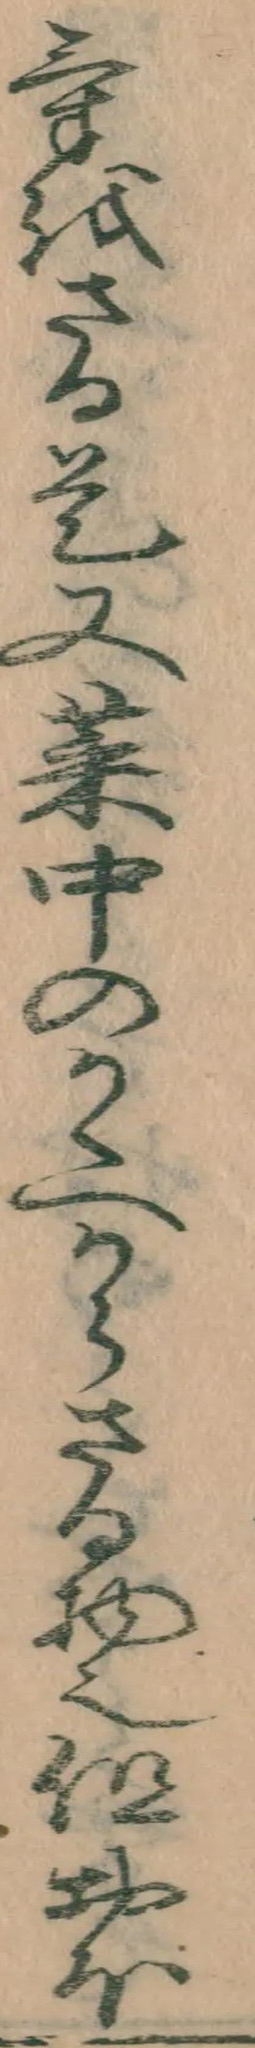気をさる是又菜中のかくへからさる物也但おほ
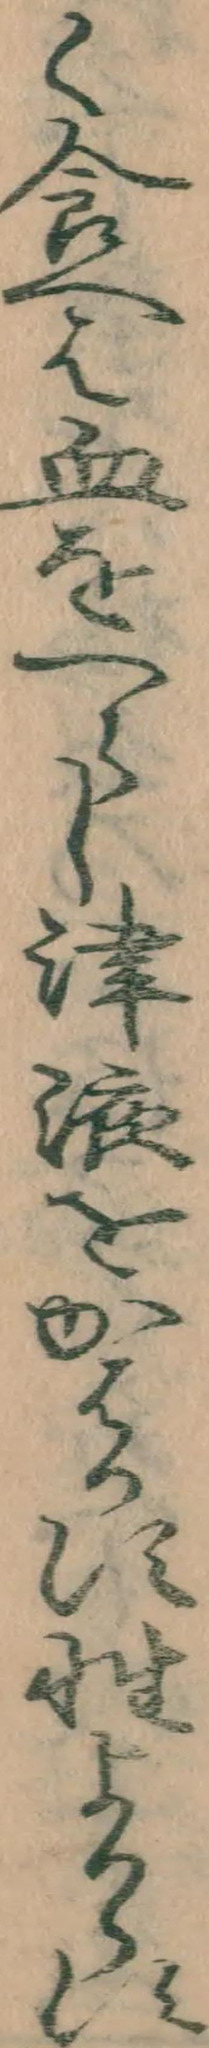く食へは血をへらし津液をかはかす性よからす
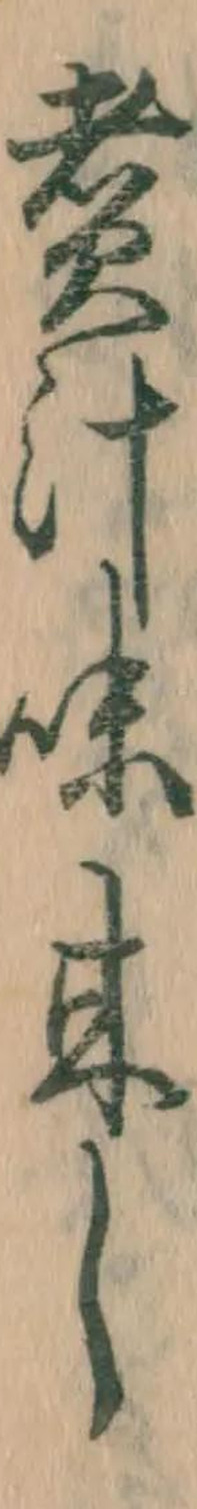煮汁味甘し
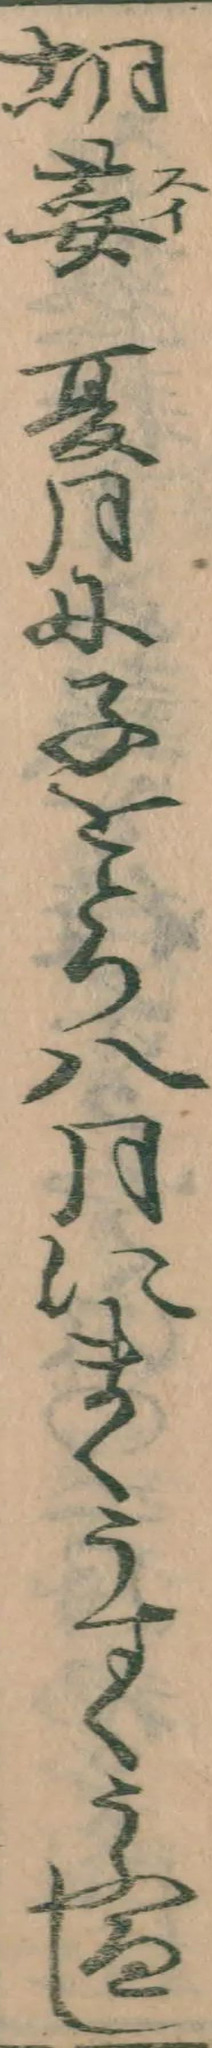胡荽夏月に子をとり八月にまくうすくうふへし
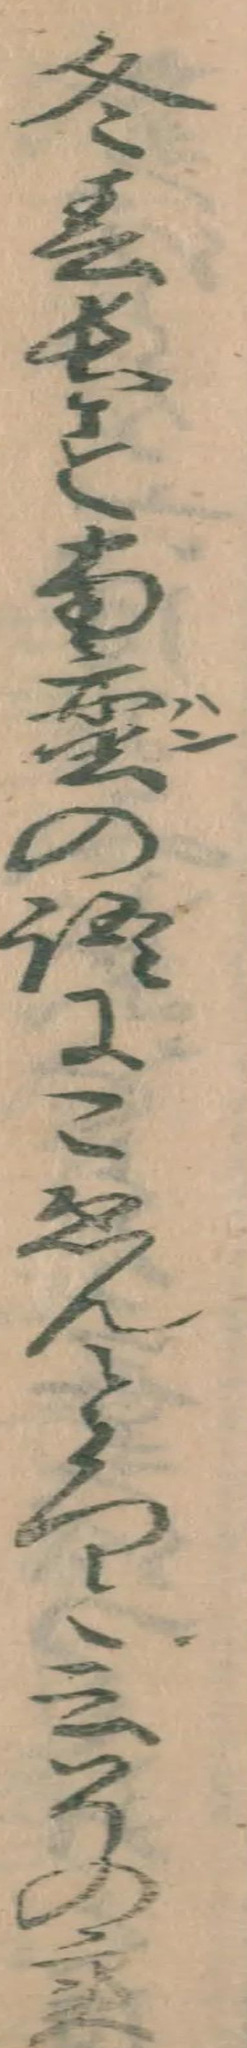冬春長す南蛮の語にこゑんとろと言その実
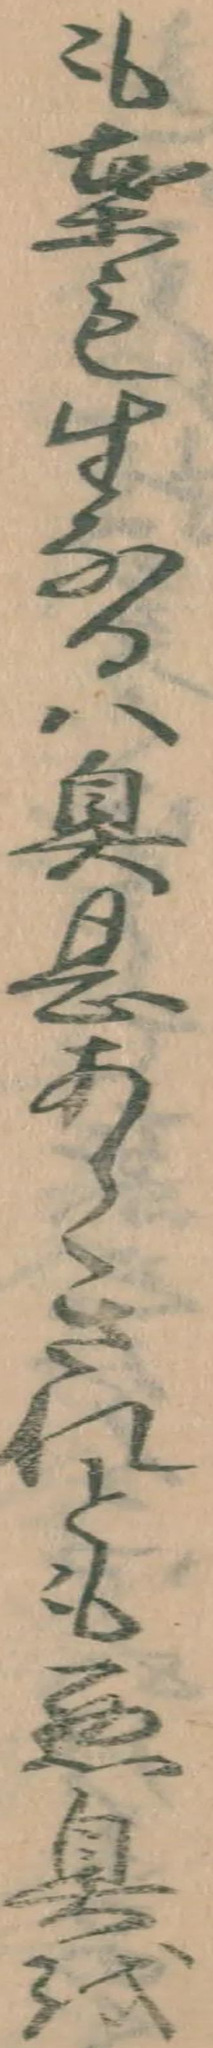も葉も生なるは臭甚あしゝされとも悪臭を
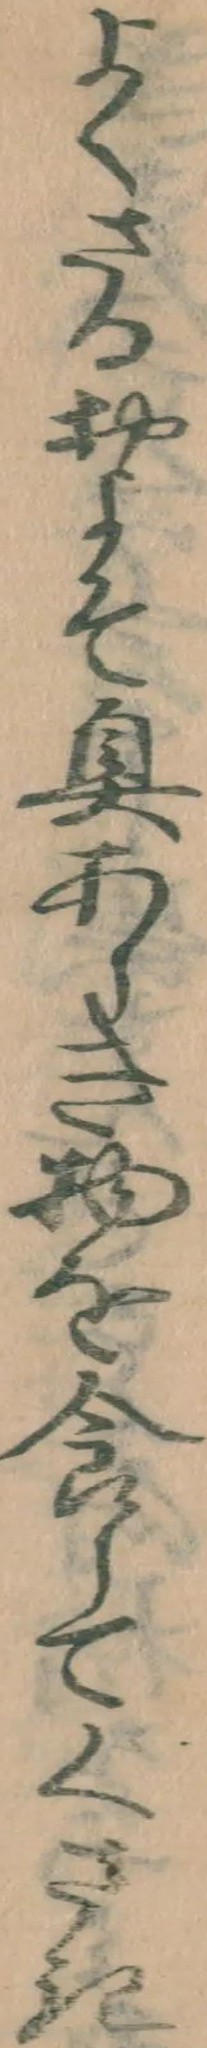よくさるおよそ臭あしき物を食してくさき
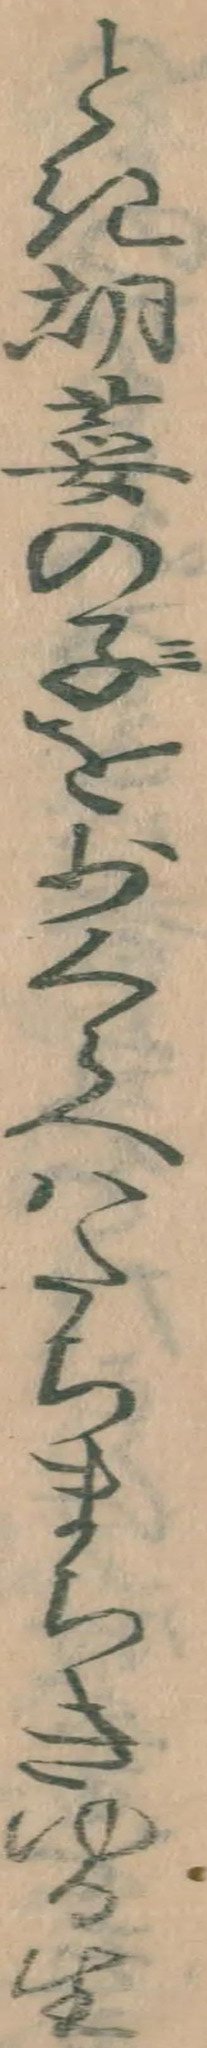とき胡荽の子を少しくらへはたちまちきゆる生
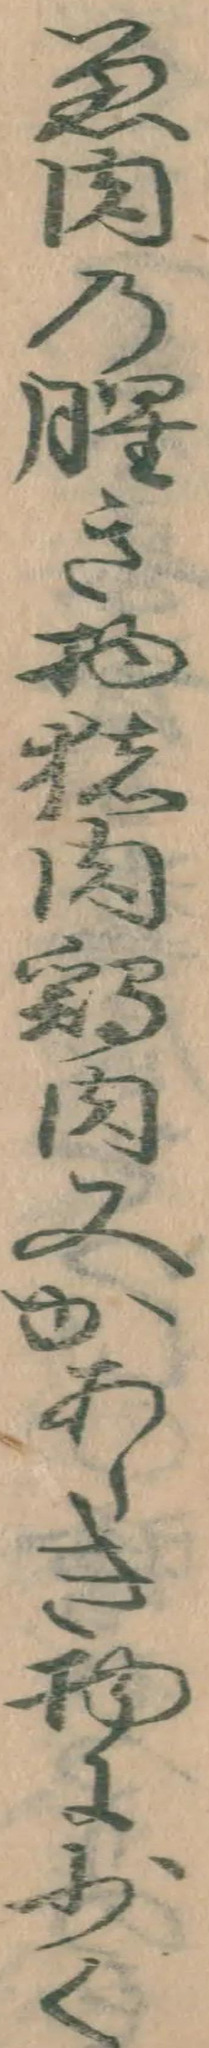魚肉の腥き物猪肉鶏肉又かあしき物に少く
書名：菜譜 3巻
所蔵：国立国会図書館 National Diet Library, JAPAN
